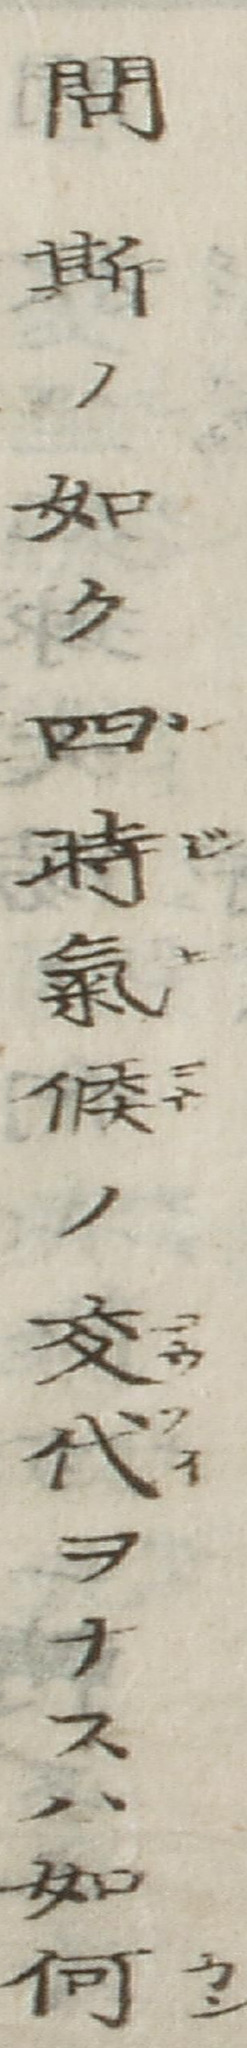問斯ノ如ク四時気候ノ交代ヲナスハ如何
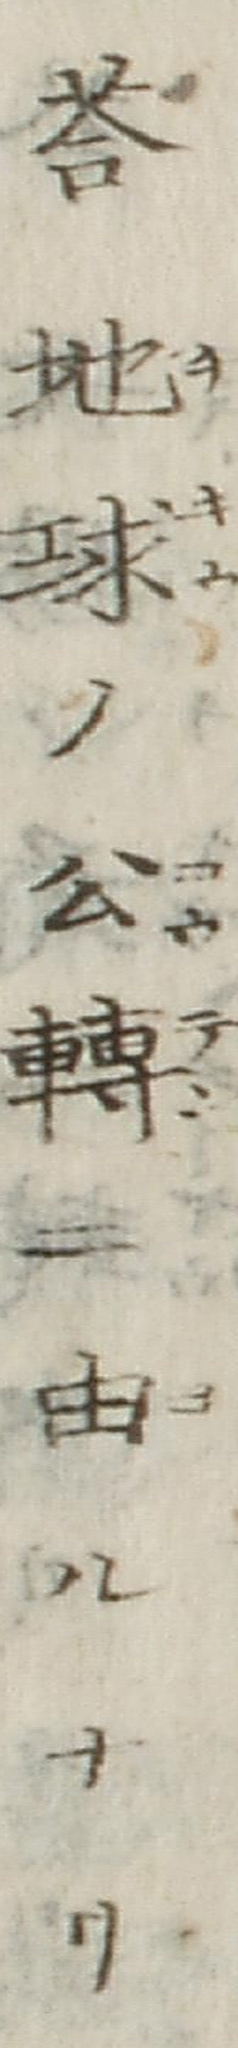答地球ノ公転ニ由ルナリ
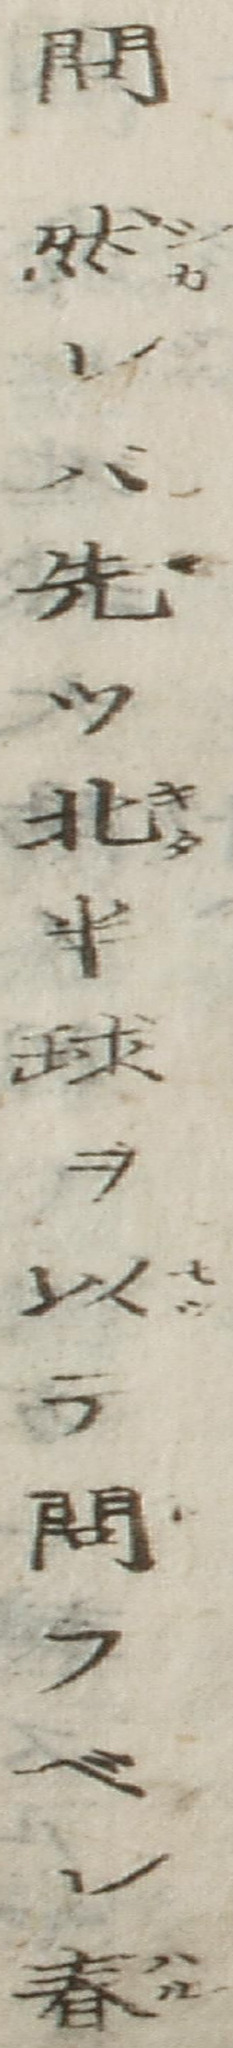問然レバ先ツ北半球ヲ以テ問フベシ春
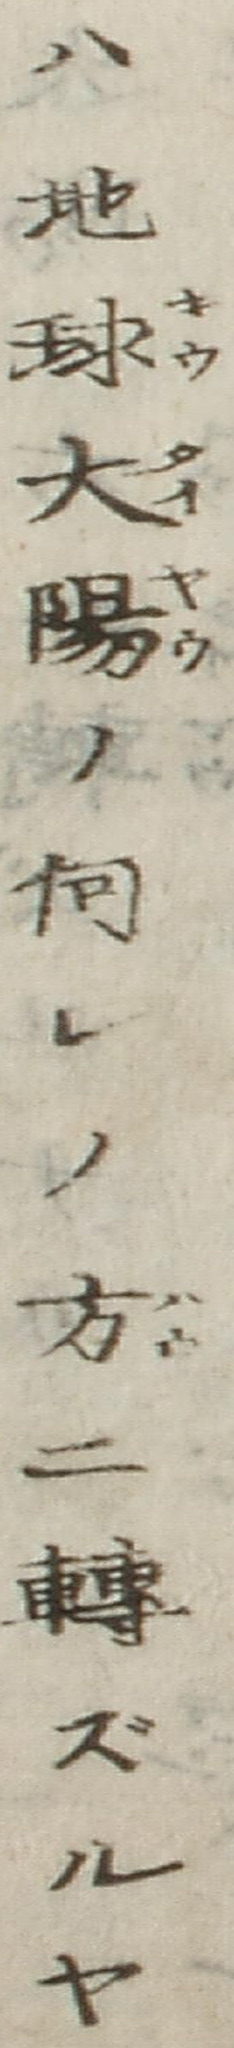ハ地球大陽ノ何レノ方ニ転ズルヤ

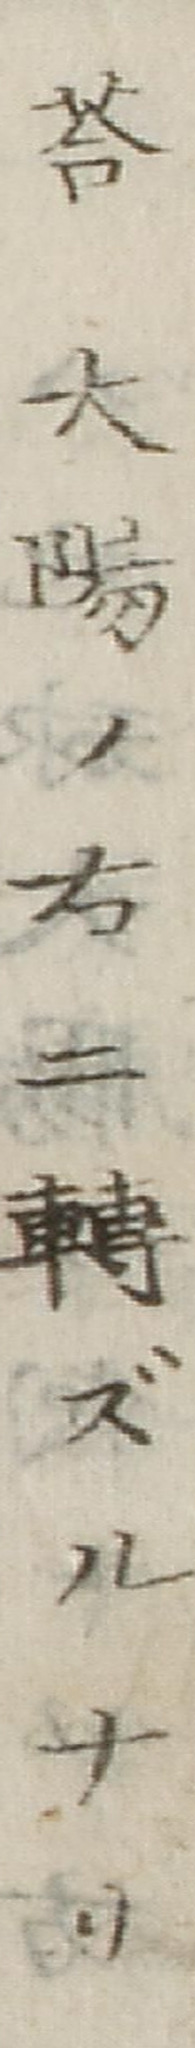答大陽ノ方ニ轉ズルナリ
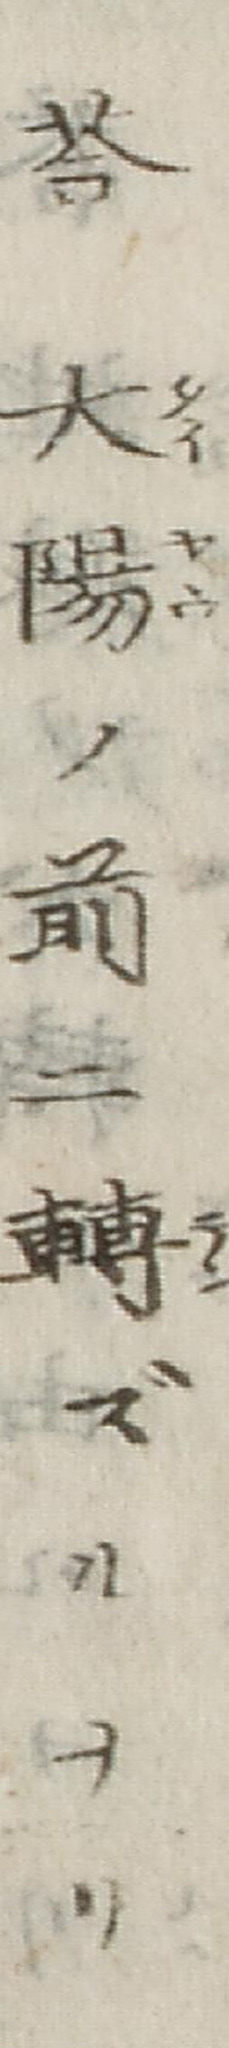答大陽ノ前ニ轉ズルナリ
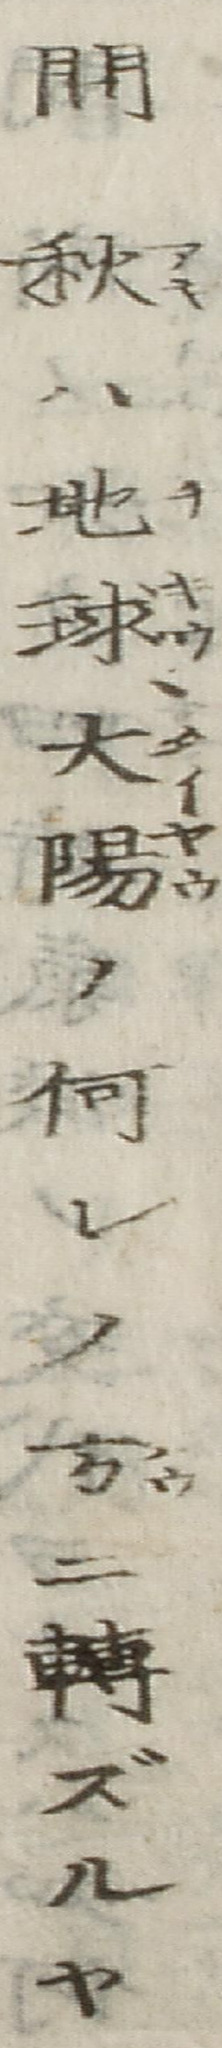問秋ハ地球、大陽ノ何レノ方ニ轉ズルヤ
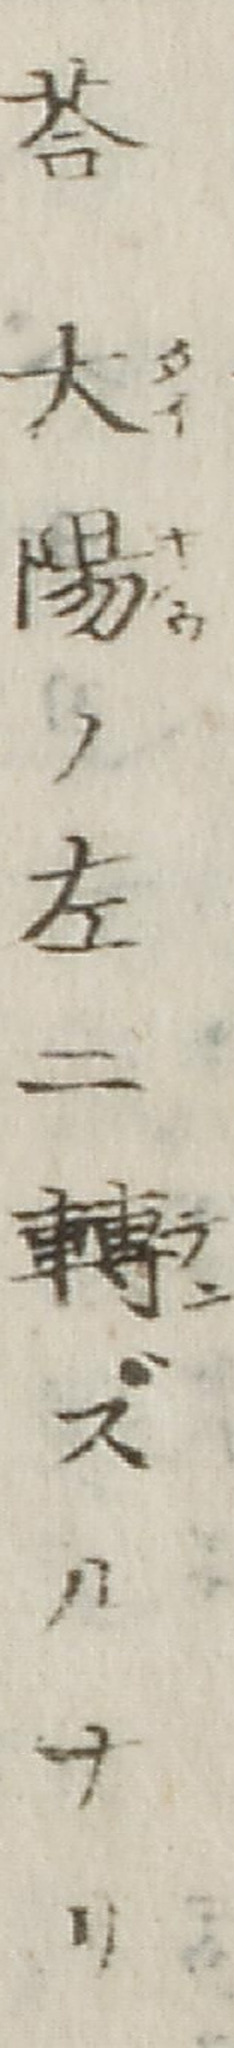答大陽ノ左ニ轉ズルナリ
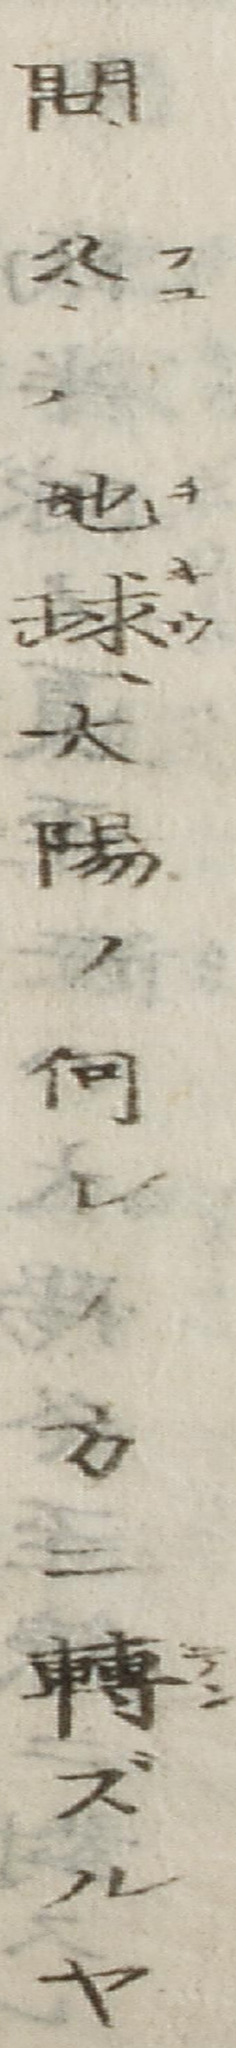問夏ハ地球大陽ノ何レノ方ニ轉ズルヤ
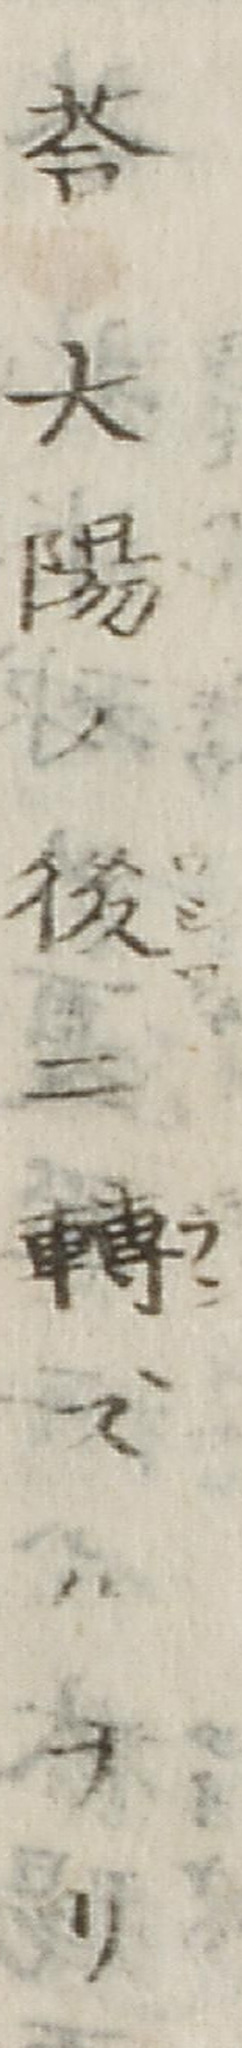答大陽ノ後ニ轉ズルナリ
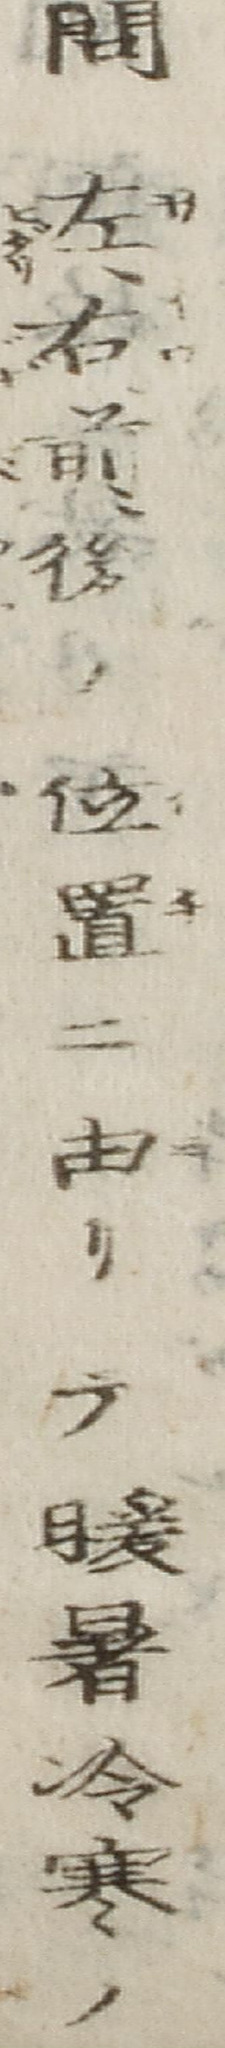問左右前後ノ位置ニ由リテ暖暑冷寒ノ
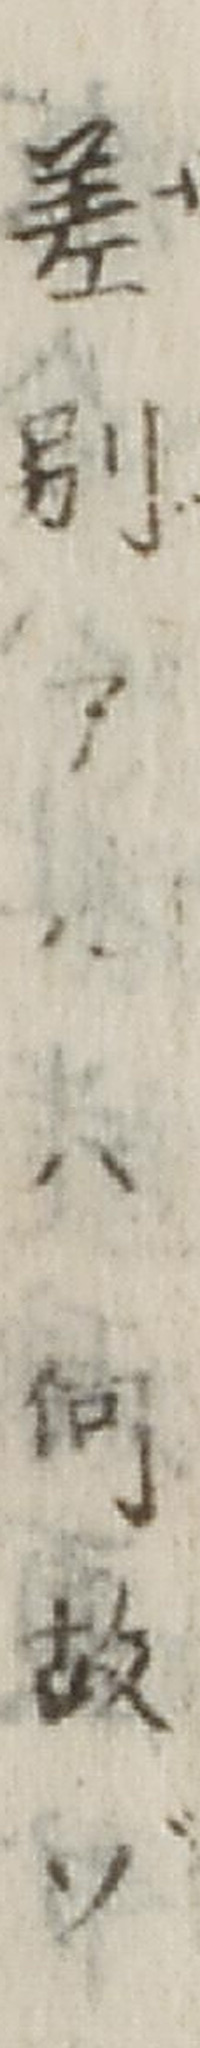差別アルハ何故ゾ
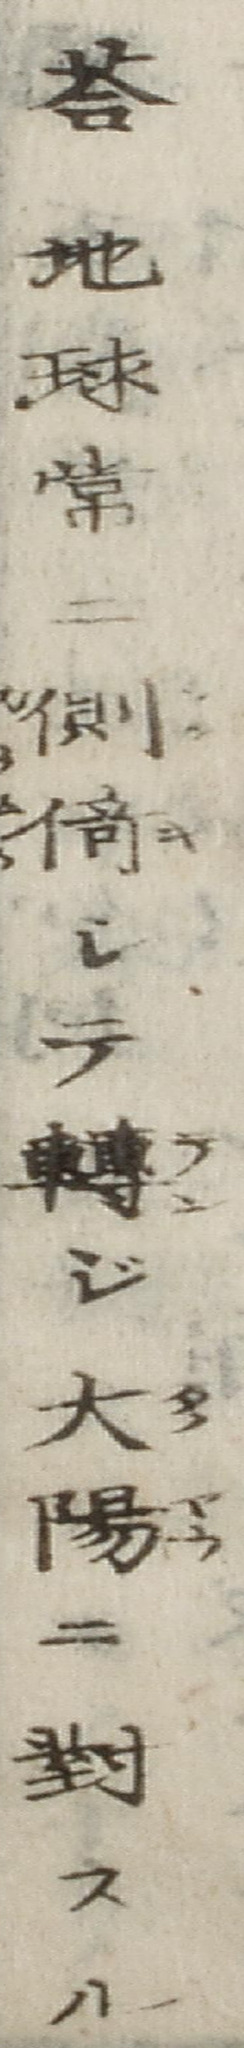答地球常ニ側倚シテ轉ジ大陽ニ対スル
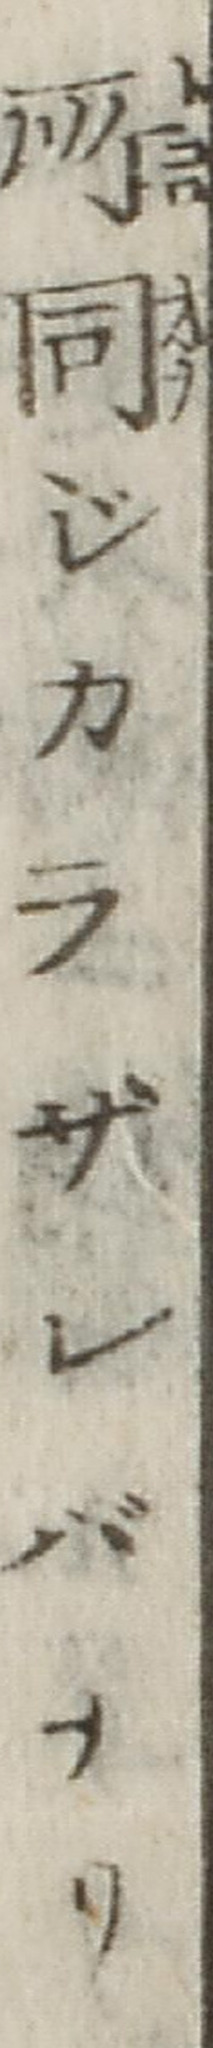所同シカラザレバナリ
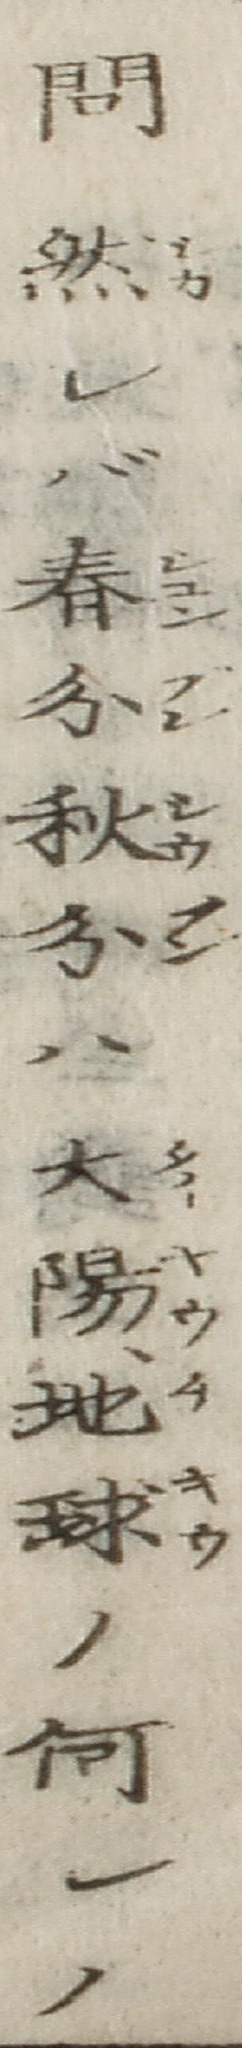問然レバ春分秋分ハ大陽、地球ノ何レノ
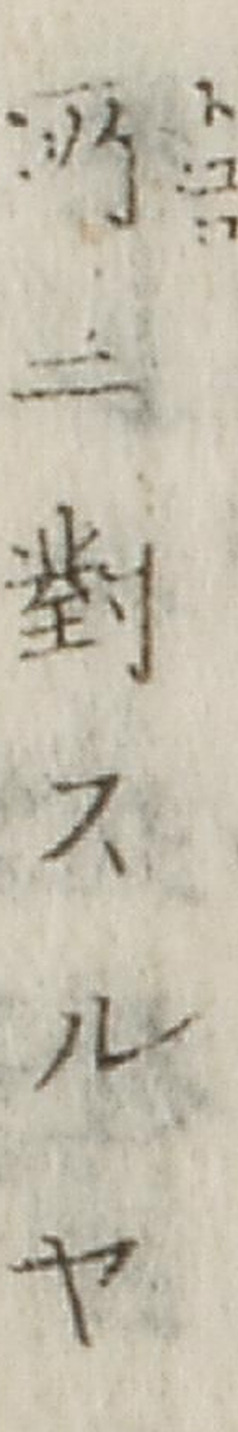所ニ対スルヤ
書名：地球儀問答　全
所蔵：東京大学地震研究所図書室 Earthquake Research Institute Library, The University of Tokyo, JAPAN
